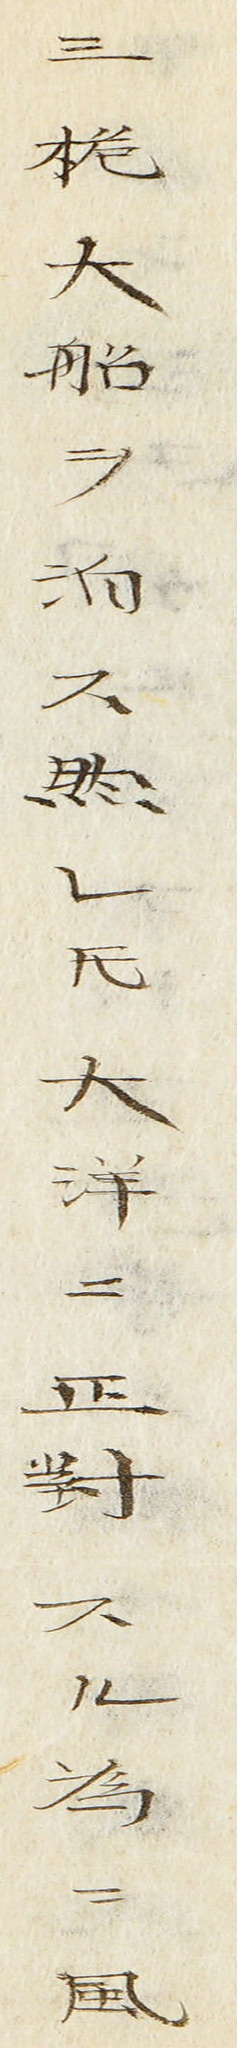三桅大船ヲ泊ス然レトモ大洋ニ正対スル為ニ風
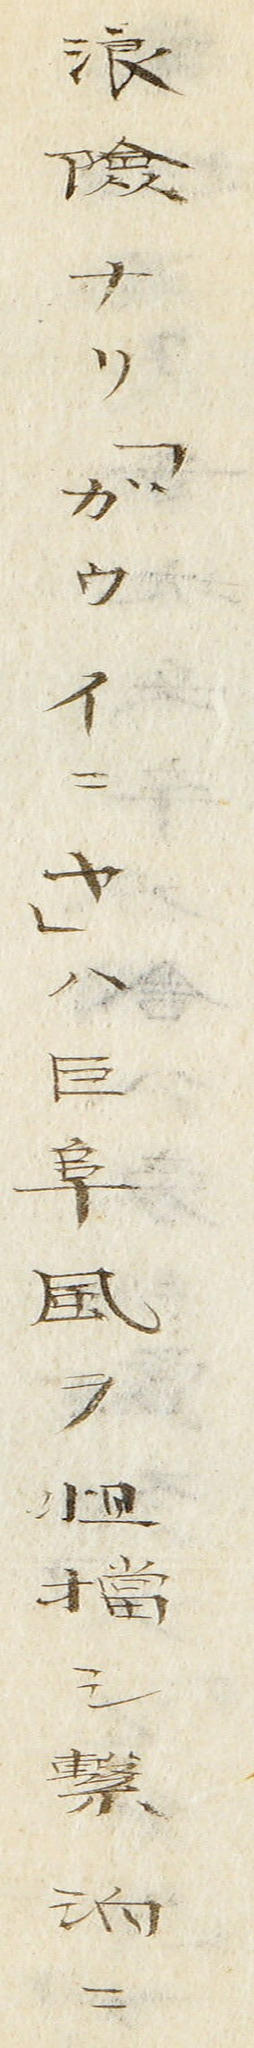浪険ナリ「ガウイニヤ」ハ巨阜風ヲ怛？擋シ繋泊ニ
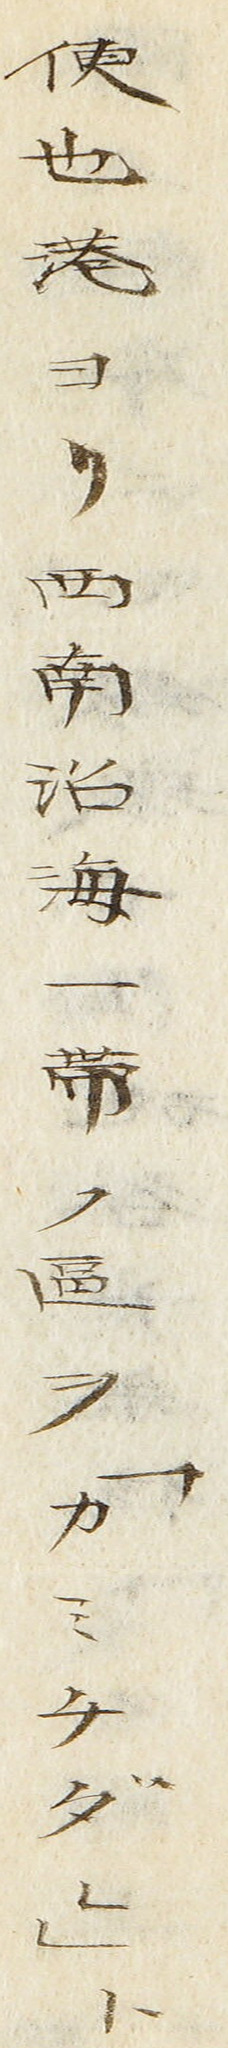便也港ヨリ西南沿海一帯ノ区ヲ「カミチダレ」ト
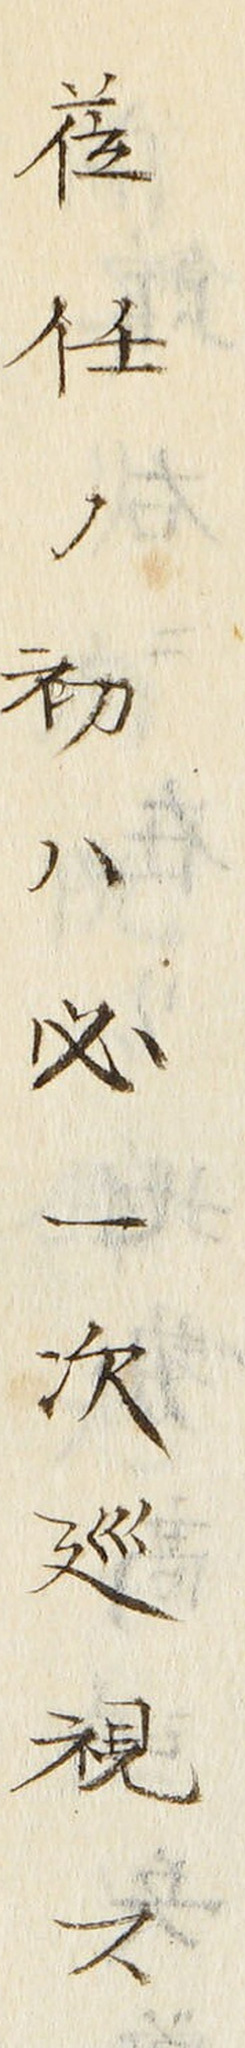莅任ノ初ハ必一次巡視ス
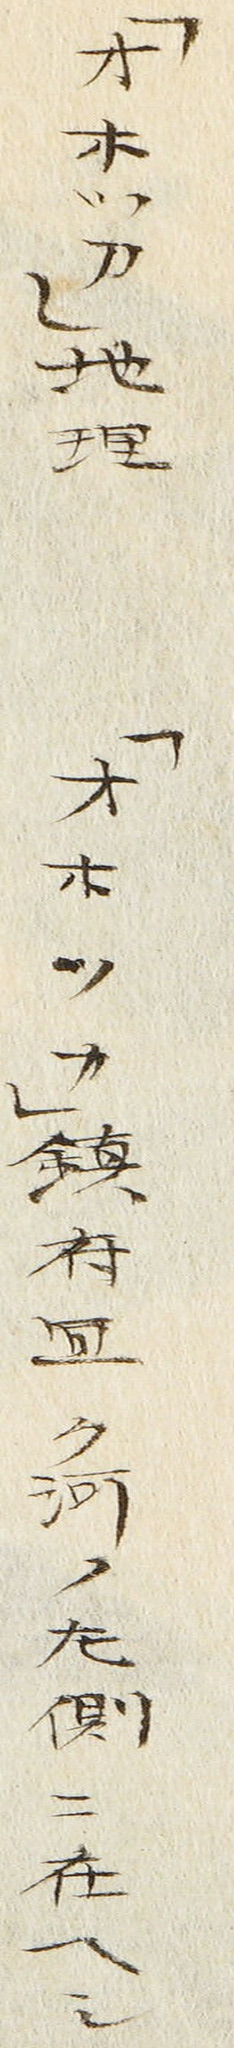「オホツカ」地理「オホツカ」鎮府宜ク河ノ左側ニ在ヘシ
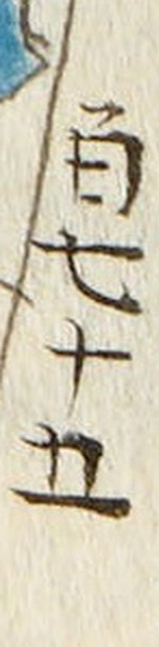百七十五

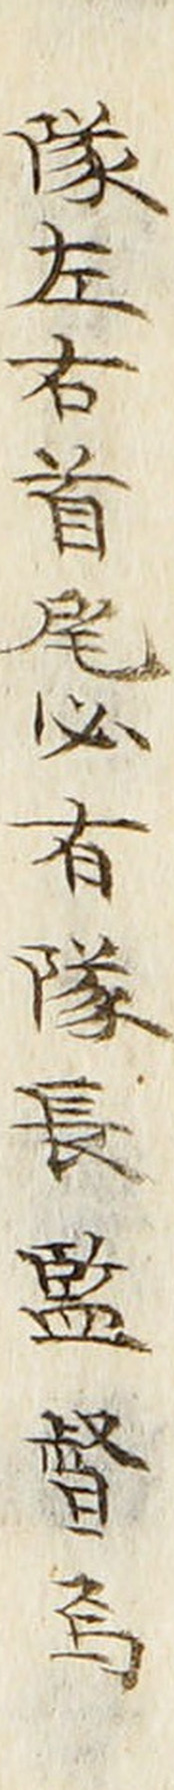隊左右首尾必有隊長監督焉？
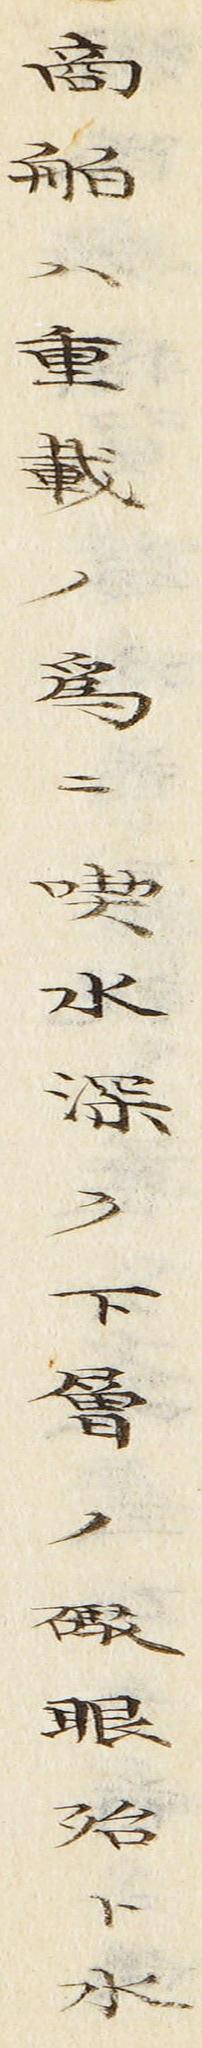〇商舶ハ重載ノ為ニ喫水深ク下層ノ礟眼殆ト水
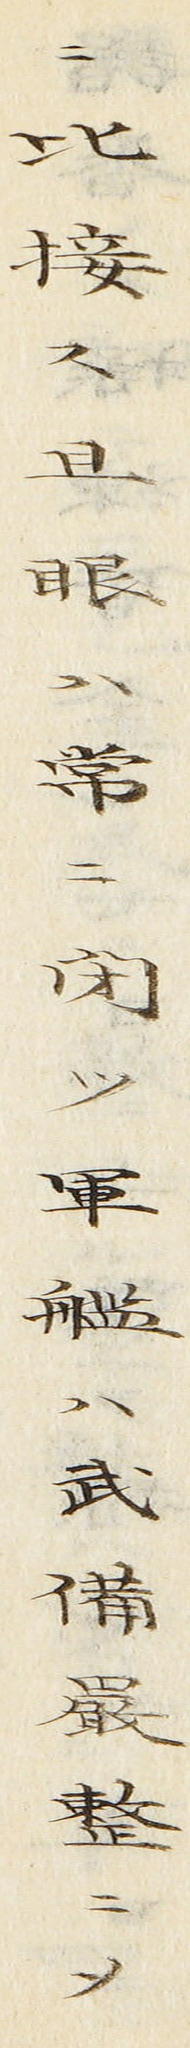ニ比接ス且眼ハ常ニ閉ツ軍艦ハ武備厳整ニシテ
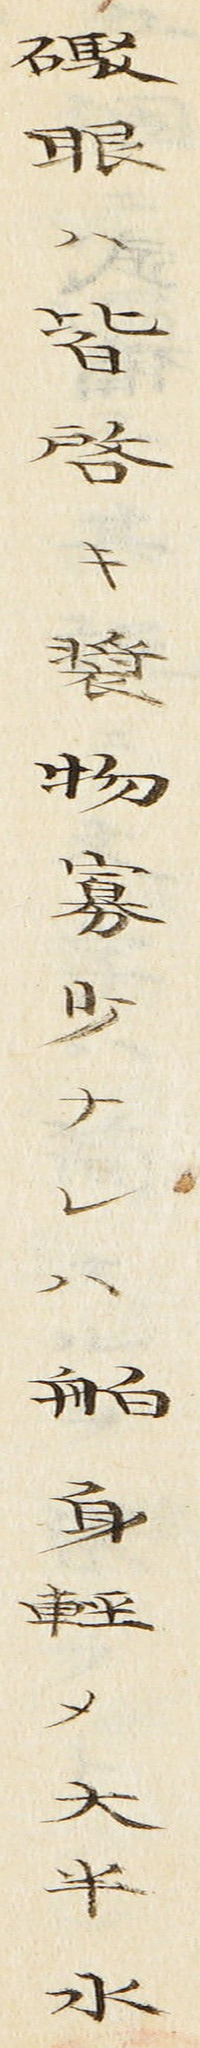礟眼ハ皆啓キ物寡少ナレハ舶身軽シテ大半水
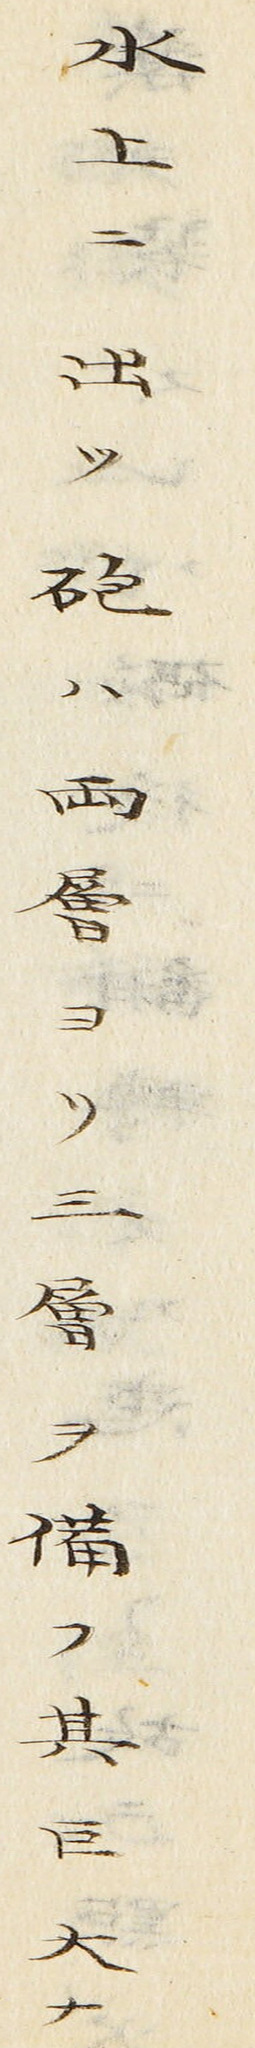水上ニ出ツ砲ハ量相両層ヨリ三層ヲ備フ其巨大ナ
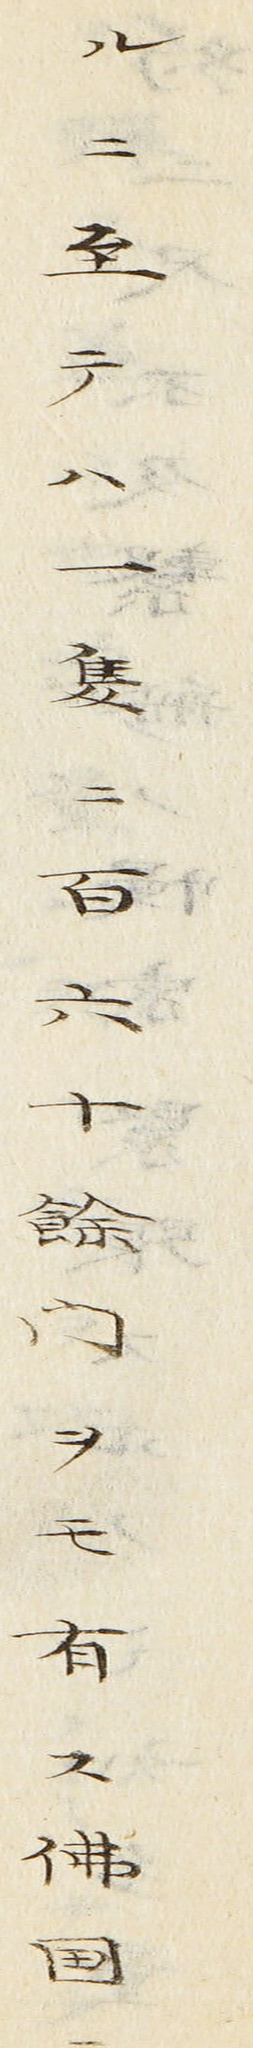ルニ至テハ一隻ニ百六十余門ヲモ有ス佛国ニ
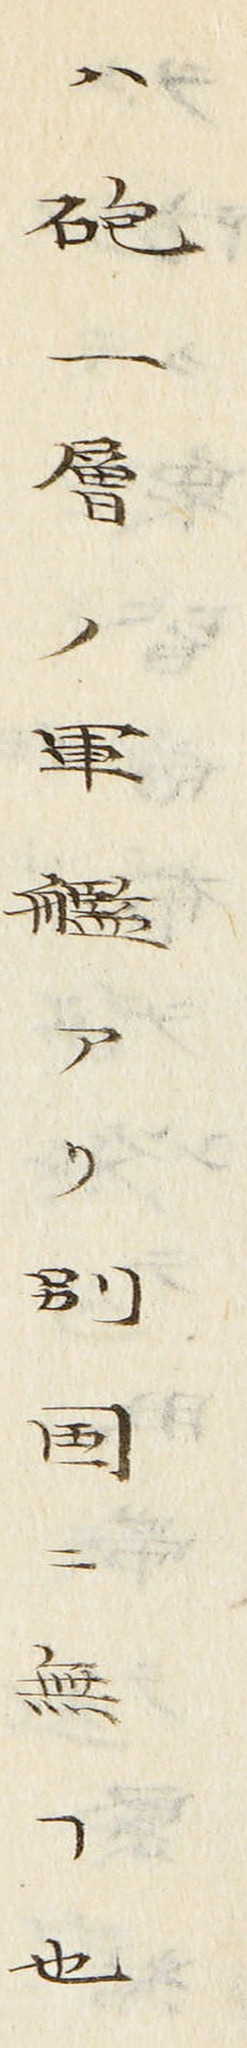ハ砲一層ノ軍艦アリ別国ニ無コト也
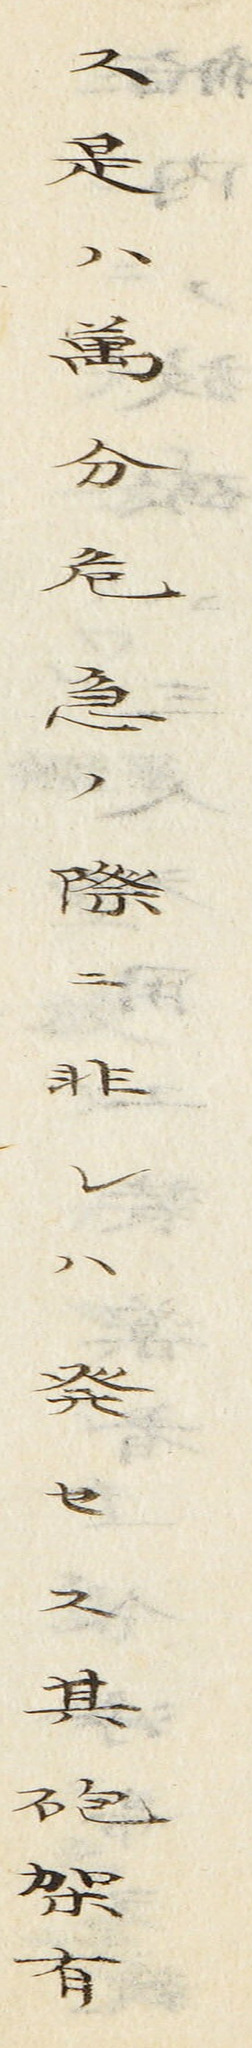ス是ハ万分危急ノ際ニ非レハ発セス其砲架有
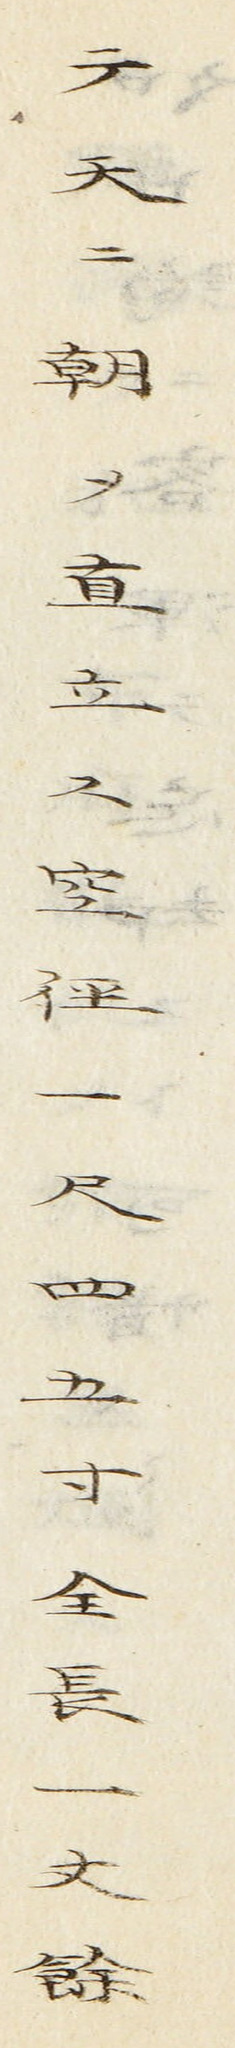テ天ニ朝シテ直立ス空径一尺四五寸全長一丈余
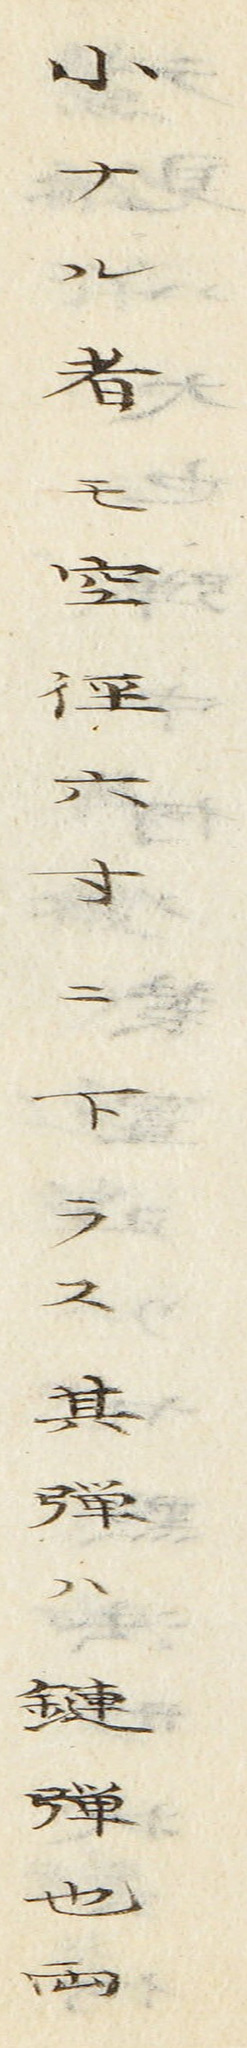小ナル者モ空径六寸ニ下ラス其弾ハ鏈弾也両
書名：蕃談
